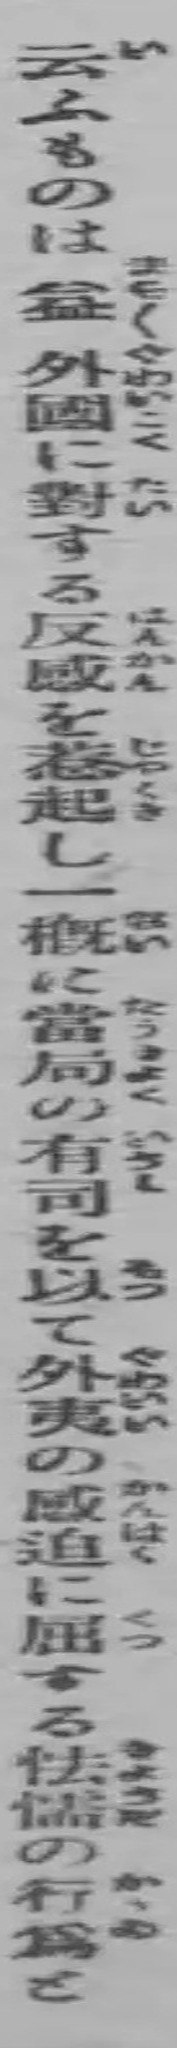云ふものは益外国に対する反感を惹起し一概に当局の有司を以て外夷の感迫に屈する怯懦の行為と
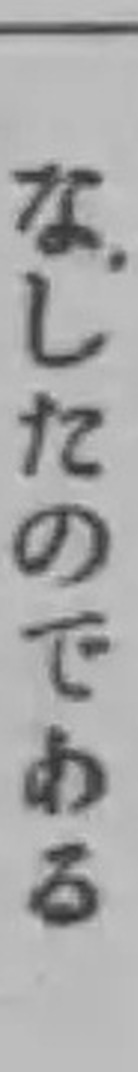なしたのである
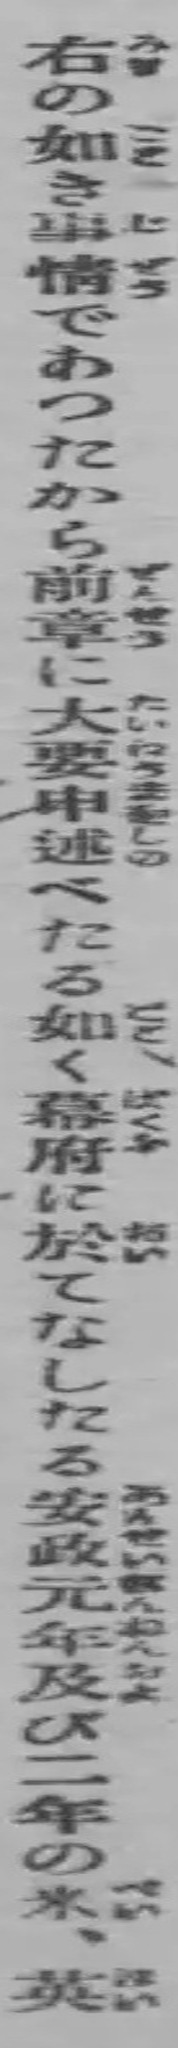右の如き事情であつたから前章に大要申述べたる如く幕府に於てなしたる安政元年及び二年の米、英
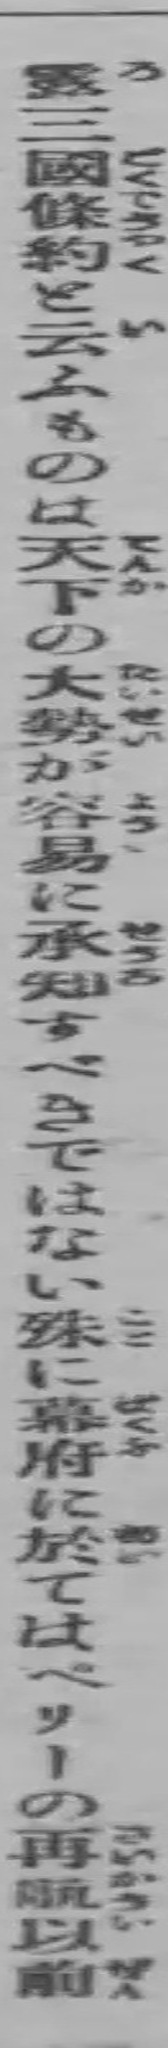露三国条約と云ふものは天下の大勢が容易に承知すべきではない殊に幕府に於てはペリーの再航以前
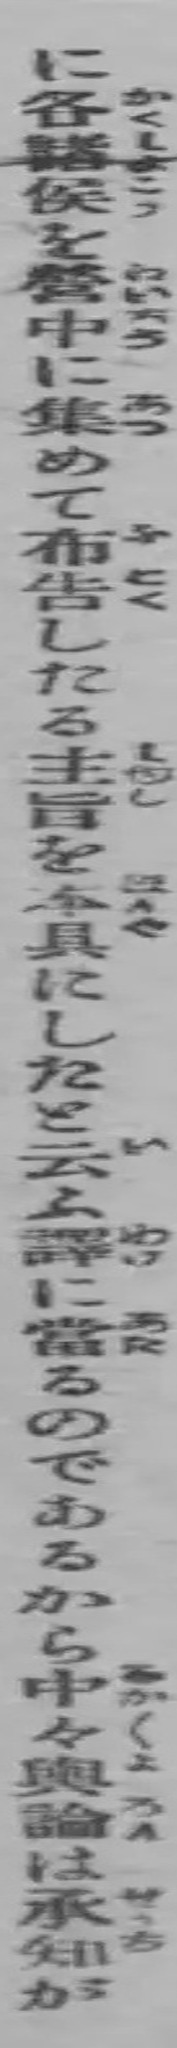に各諸侯を営中に集めて布告したる主旨を本具にしたと云ふ訳に当るのであるから中々輿論は承知が
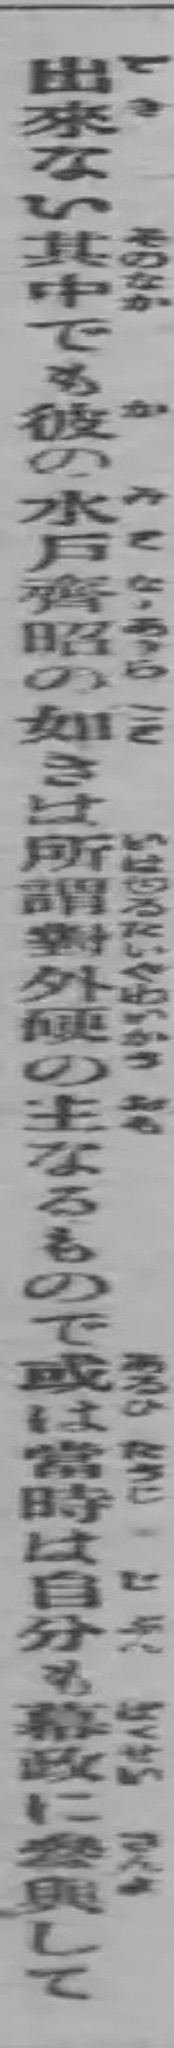出来ない其中でも彼の水戸斉昭の如きは所謂対外硬の主なるもので或は当時は自分も幕政に参与して

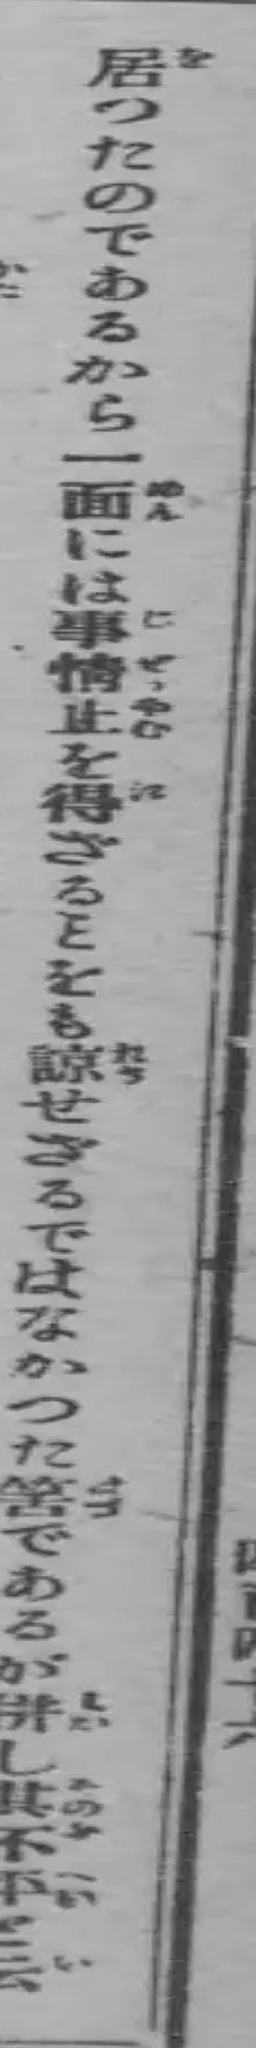居つたのであるから一面には事情止を得ざることをも諒せざるではなかつた筈であるが併し其不平と云
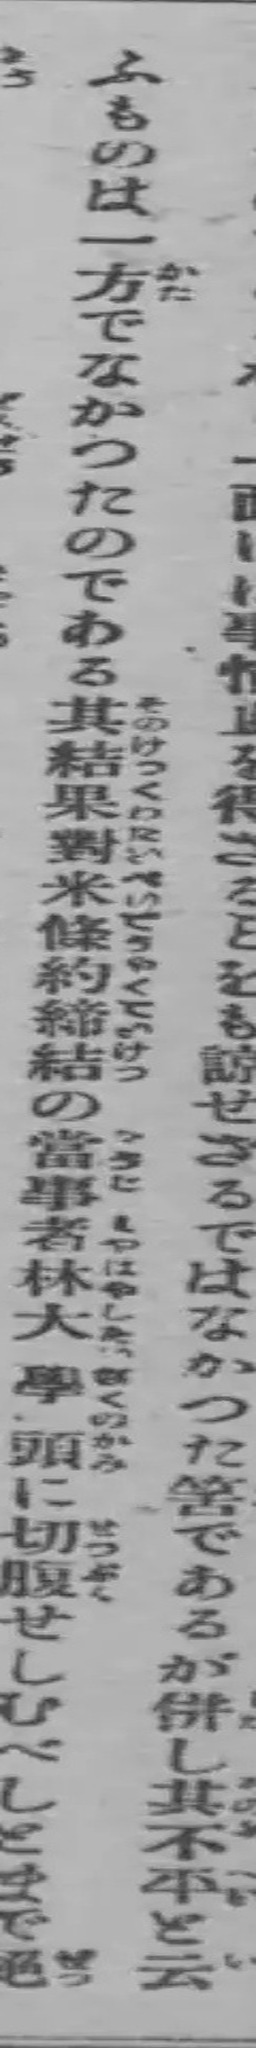ふものは一方でなかつたのである其結果対米条約締結の当事者林大学頭に切腹せしむべしとまで絶
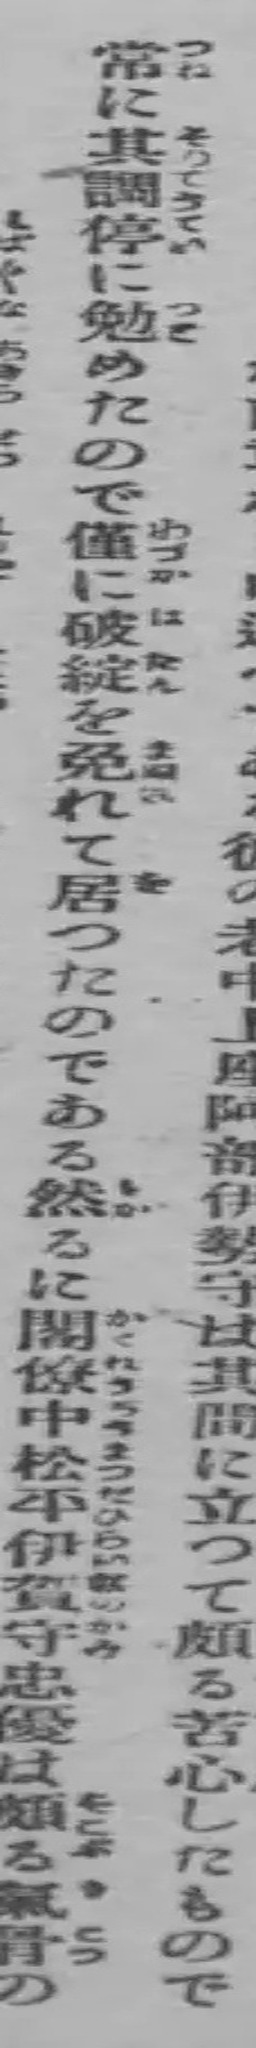常に其調停に勉めたので僅に破綻を免れて居つたのである然るに閣僚中松平伊賀守忠優は頗る気骨の
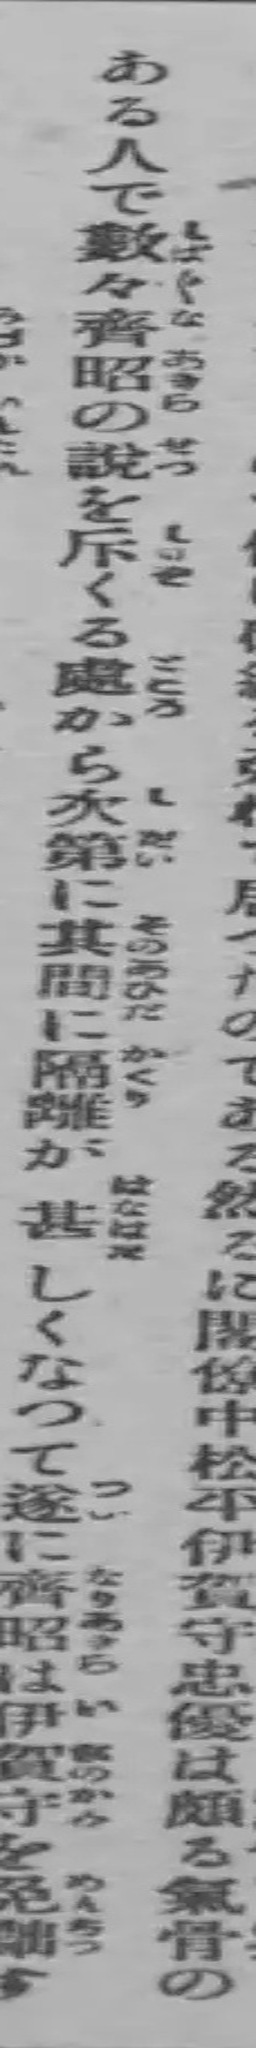ある人で数々斉昭の説を斥くる処から次第に其間に隔離が甚しくなつて遂に斉昭は伊賀守を免黜す
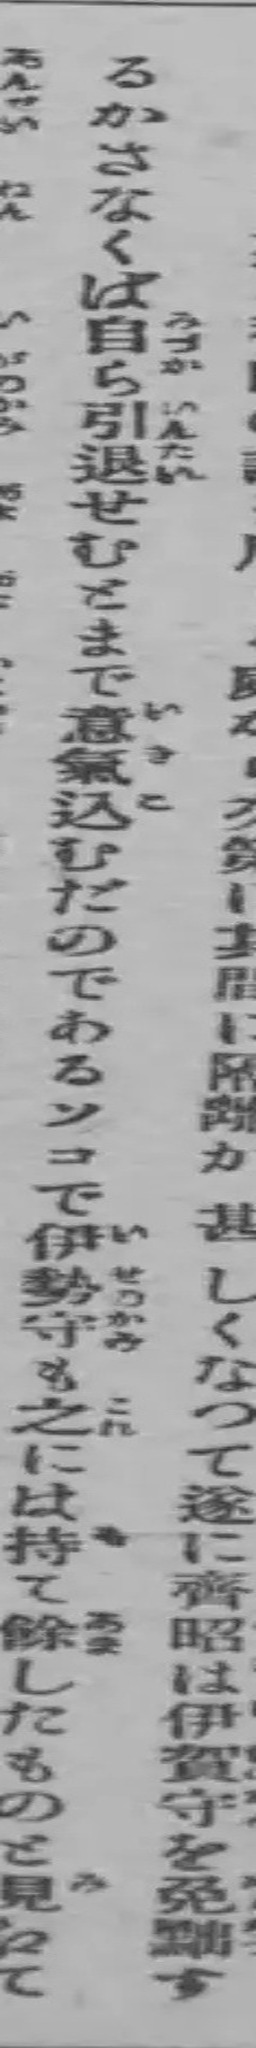るかさなくば自ら引退せむとまで意気込むだのであるソコで伊賀守も之には持て余したものと見えて
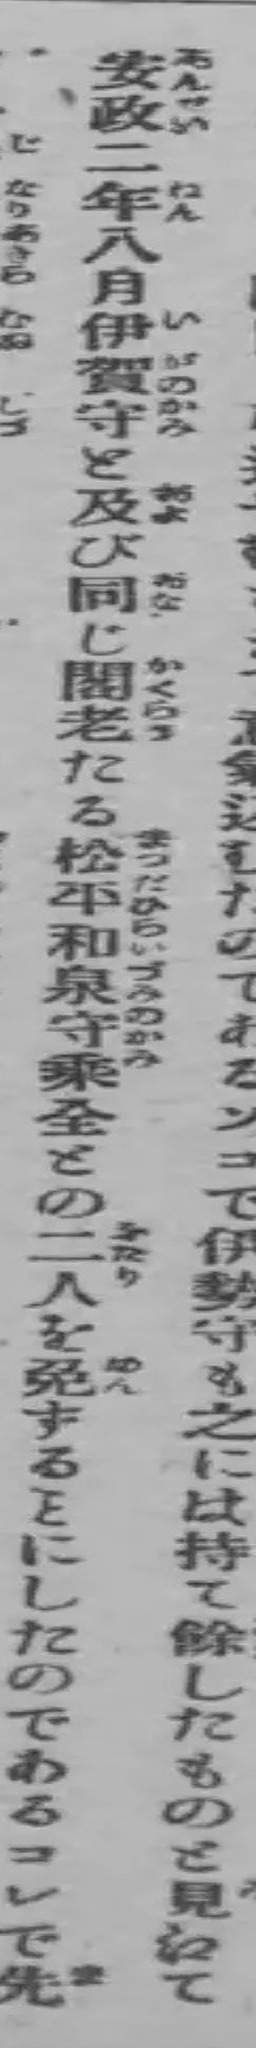安政二年八月伊賀守と及び同じ閣老たる松平伊豆守乗全との二人を免ずることにしたのであるコレで先
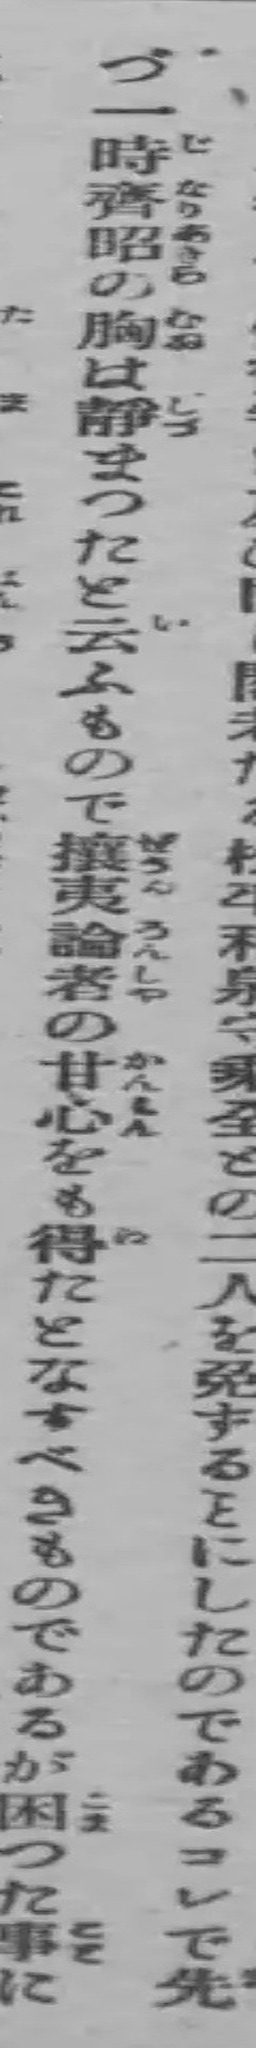づ一時斉昭の胸は静まつたと云ふもので攘夷論者の甘心をも得たとなすべきものであるが困つた事に
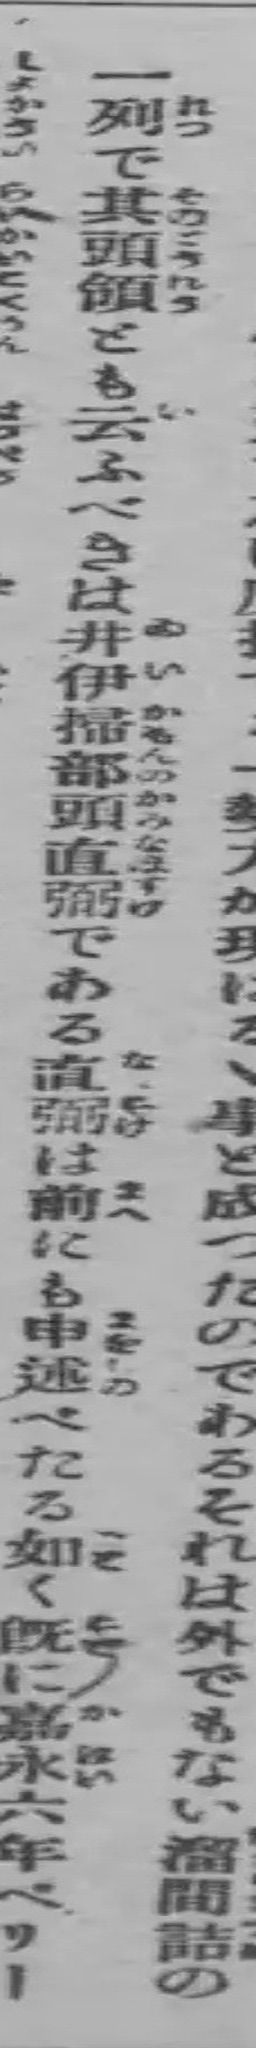一列で其頭領とも云ふべきは井伊掃部頭直弼である直弼は前にも申述べたる如く既に嘉永六年ペリー
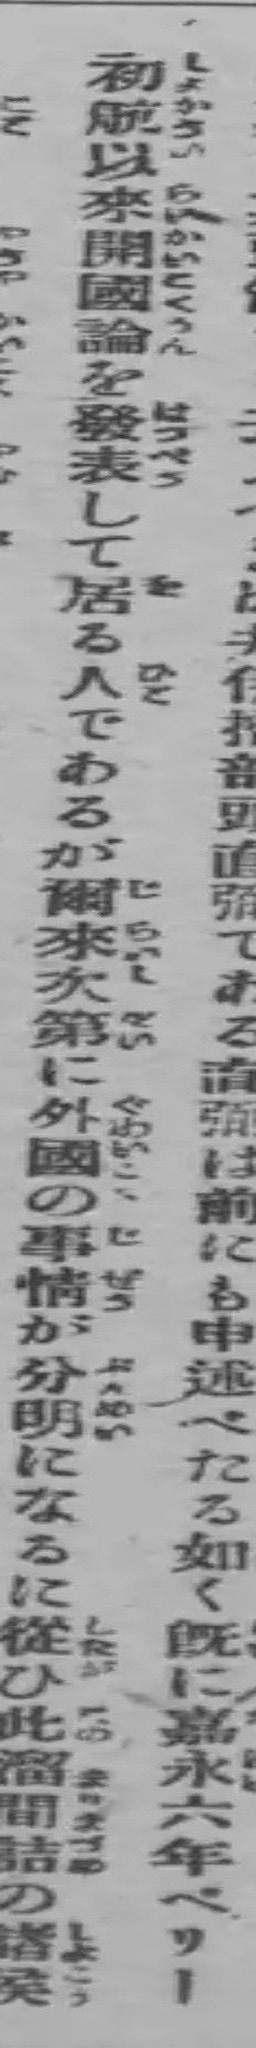初航以来開国論を発表して居る人であるが爾来次第に外国の事情が分明になるに従ひ此溜間詰の諸侯
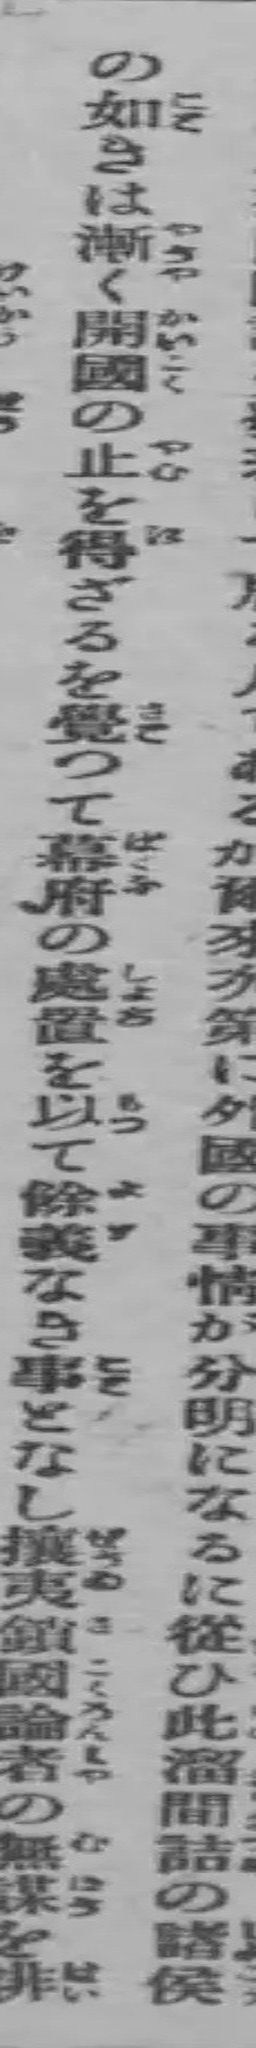の如きは漸く開国の止を得ざるを覚つて幕府の処置を以て余義なき事となし攘夷論者の無謀を排
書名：豊橋市史談
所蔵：国立国会図書館 National Diet Library, JAPAN
